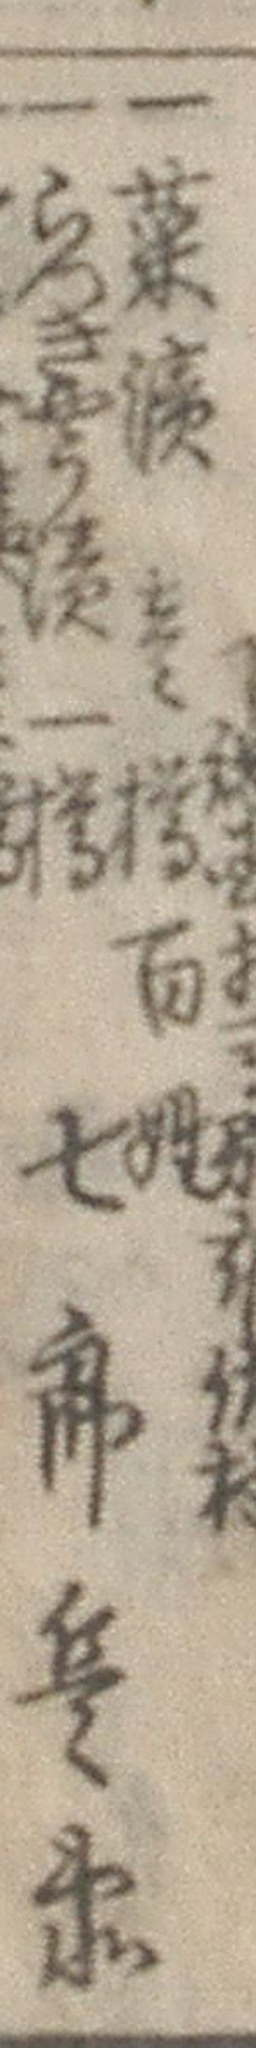一らつきゃう漬一樽七郎兵衛
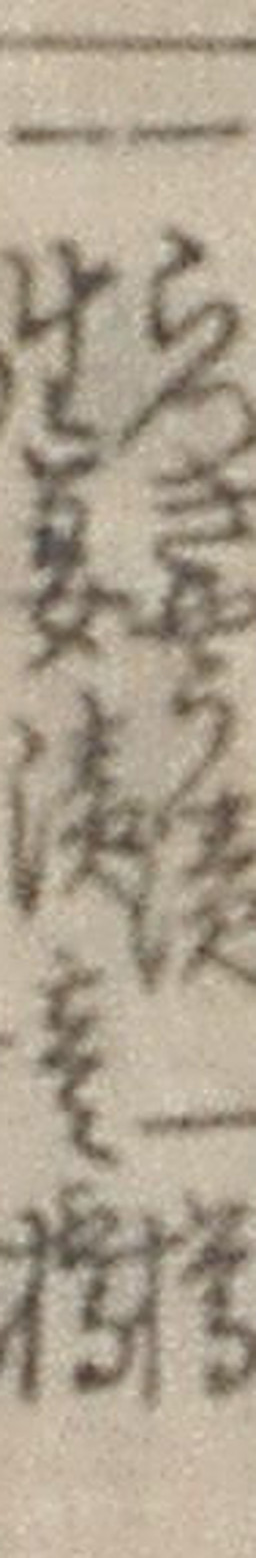一生姜漬壱樽
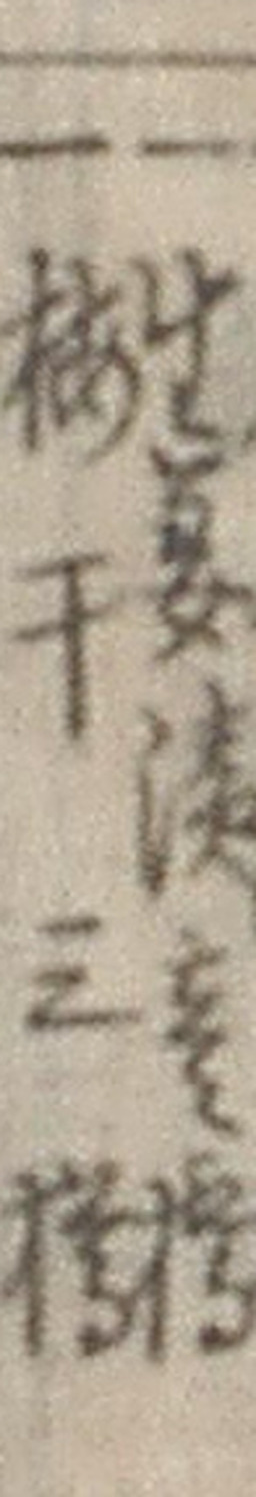一梅干三樽
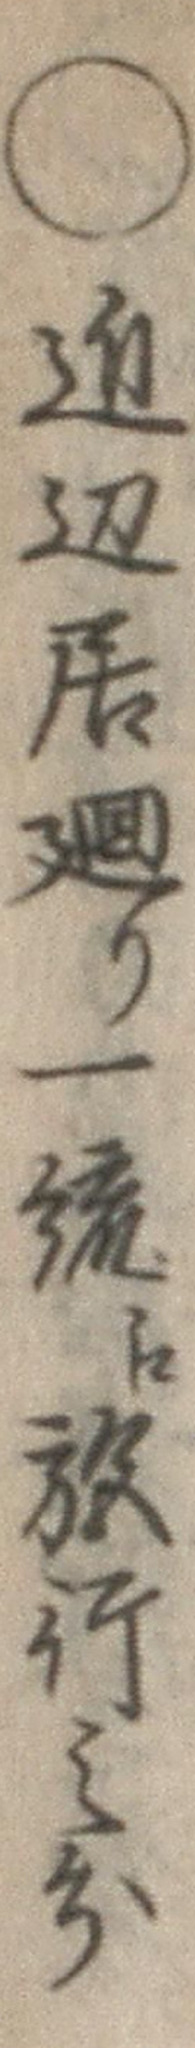〇近辺居廻り一統え施行之分
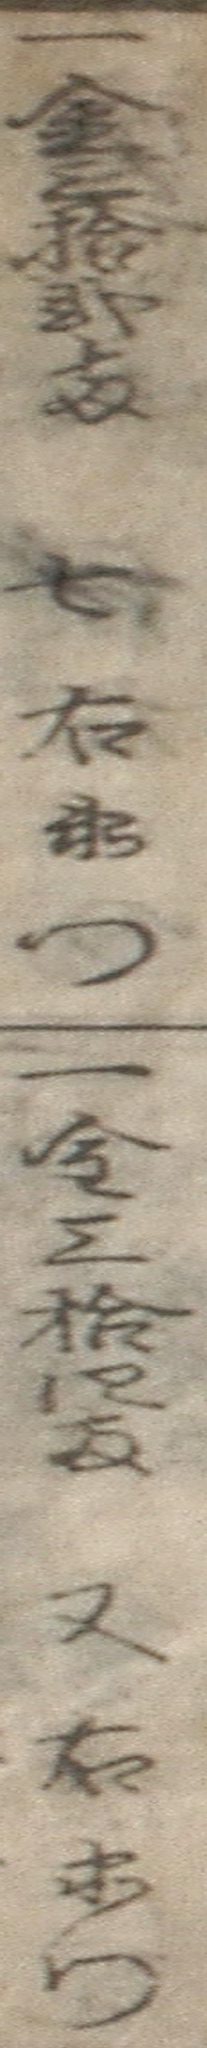一金三拾弐両七右衛門一金三拾四両又右衛門
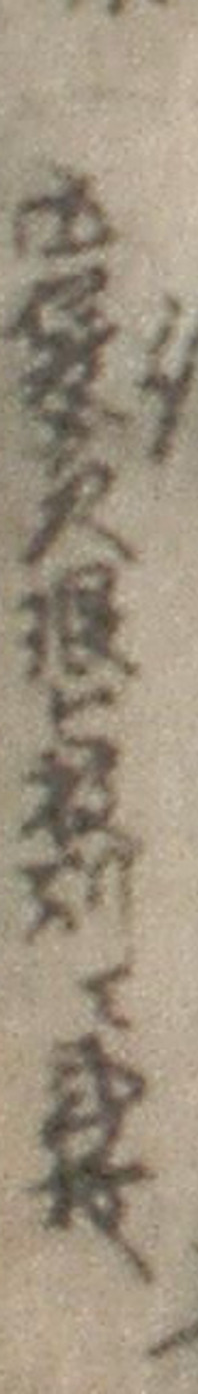御褒美銀七枚別て弐枚

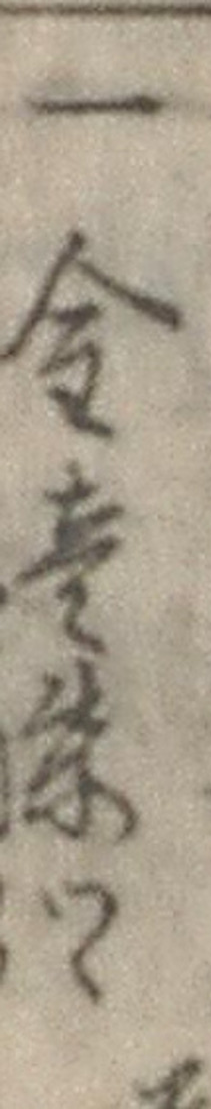一金一朱ツゝ
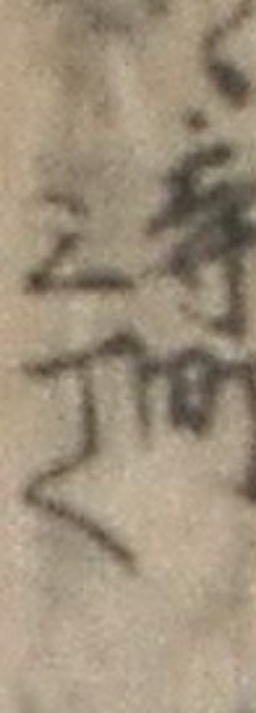三丁へ
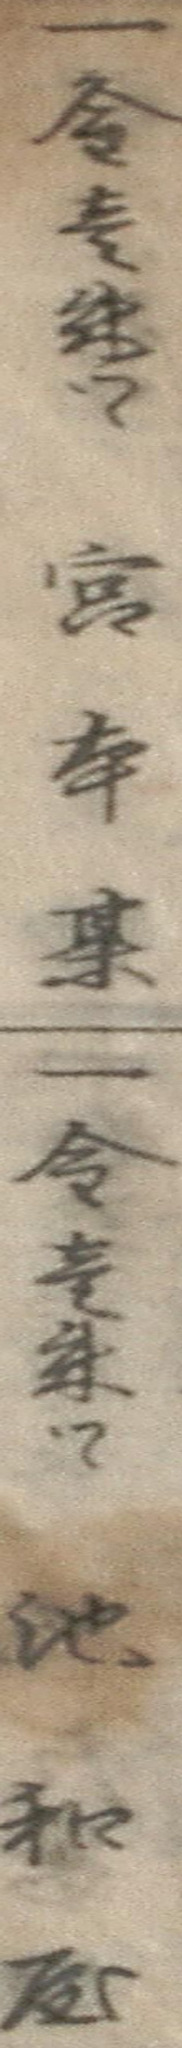一金壱朱ツゝ宮本某一金壱朱ツゝ池和屋
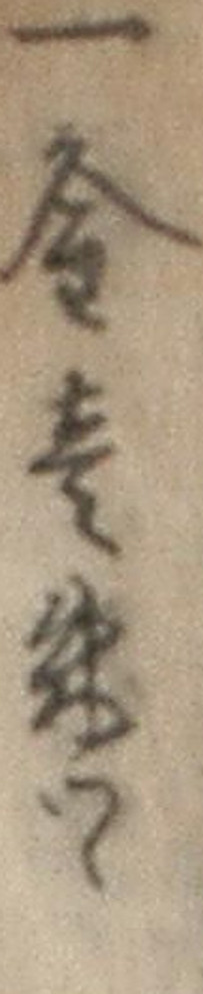一金一朱ツゝ
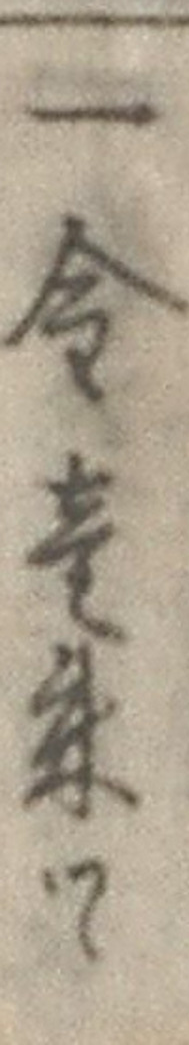一金一朱ツゝ
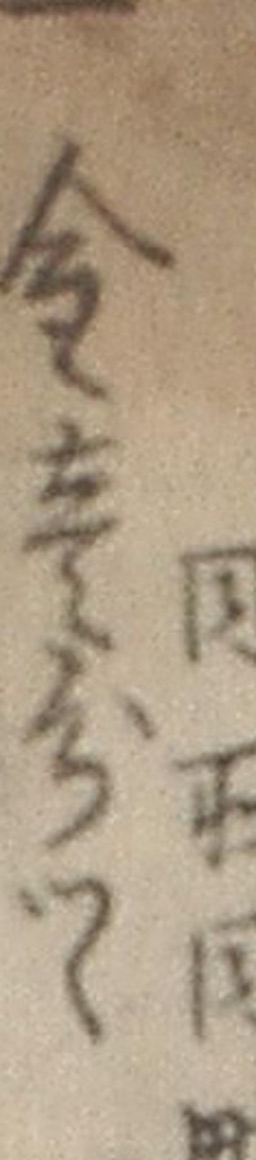一金一朱ツゝ
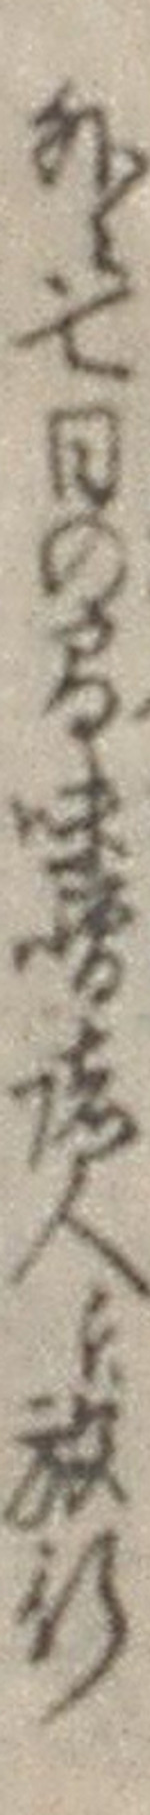外二七日の間味噌諸人え施行
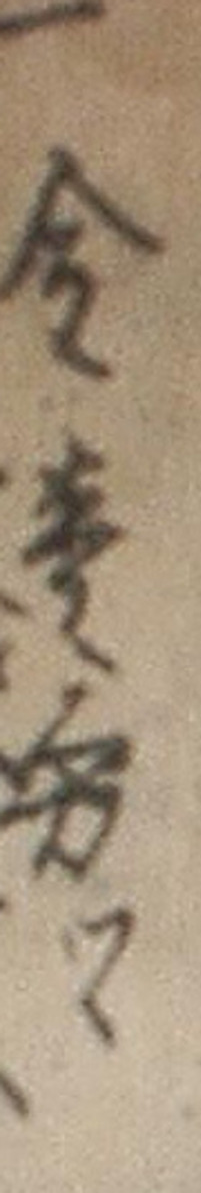一金一朱ツゝ
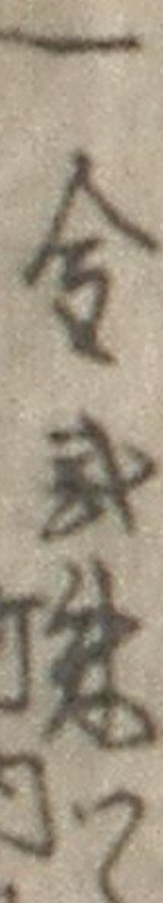一金一朱ツゝ
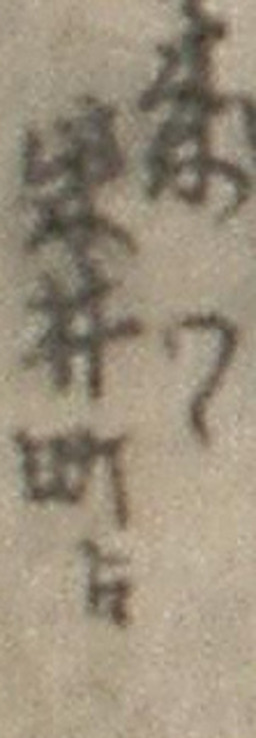柴井町え
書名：江戸大地震末代鑑
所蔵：東京大学地震研究所図書室 Earthquake Research Institute Library, The University of Tokyo, JAPAN
